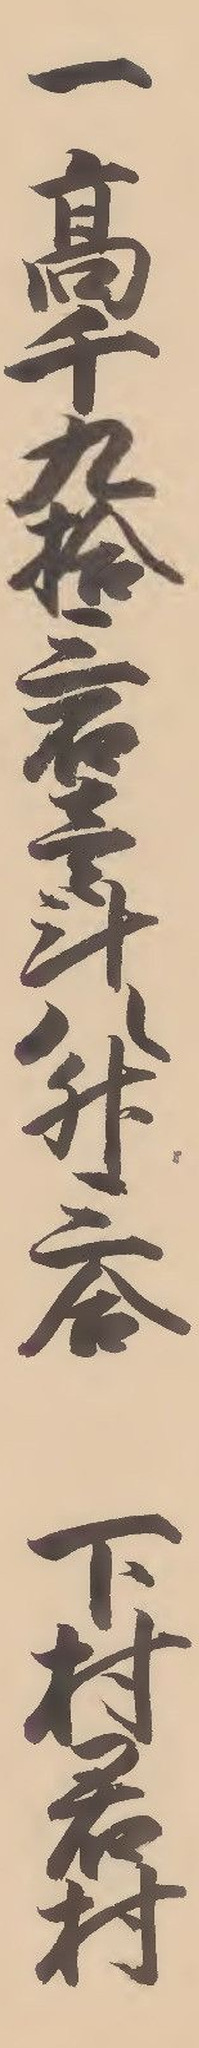一高千九拾三石壱斗八升三合下村君村

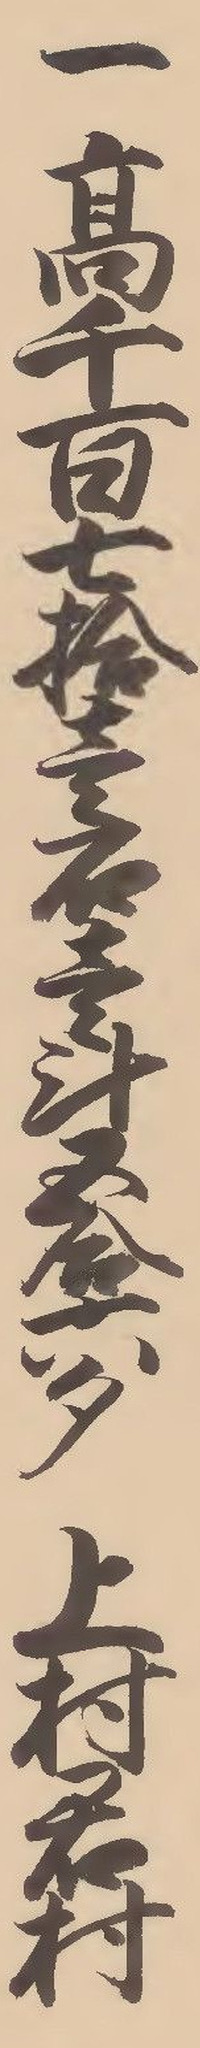一高千百七拾壱石壱斗五合六勺上村君村
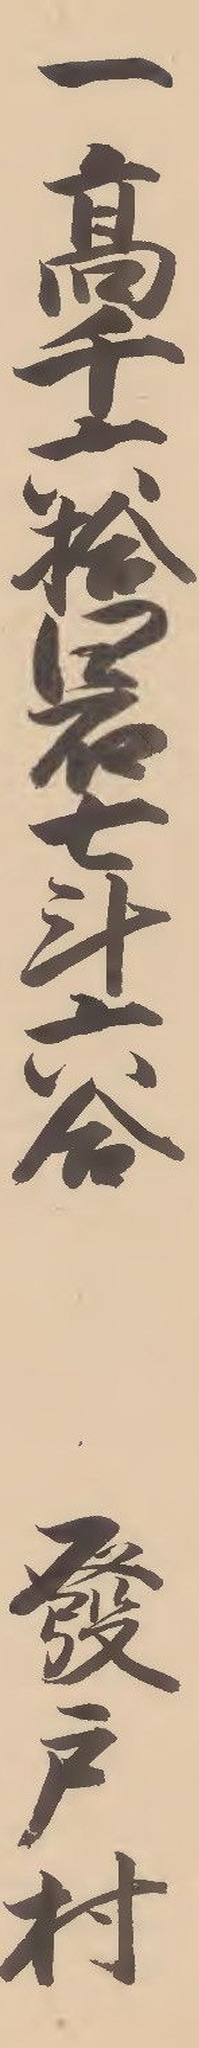一高千六拾四石七斗六合発戸村
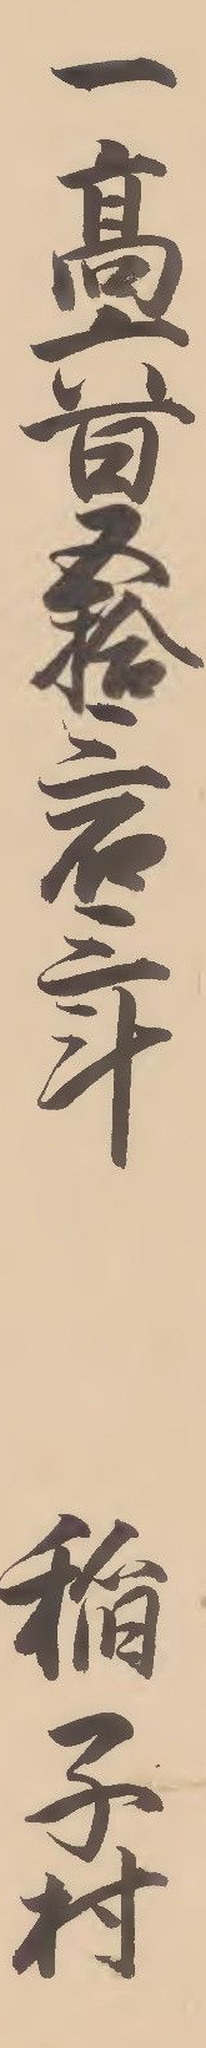一高六百五拾三石三斗稲子村
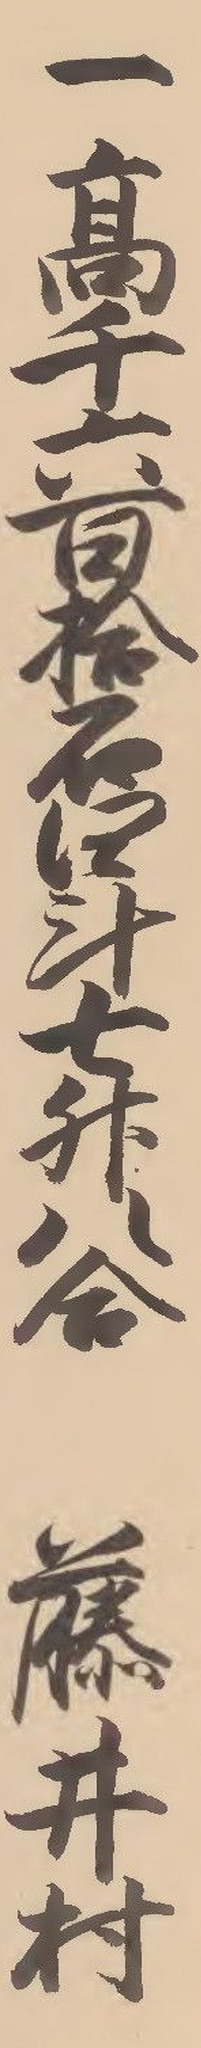一高千六百拾石四斗七升八合藤井村
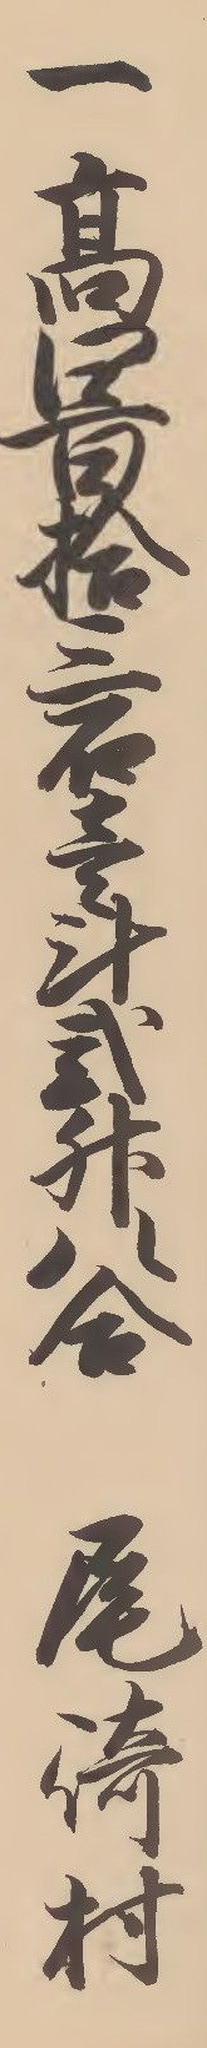一高四百拾三石壱斗弐升八合尾崎村
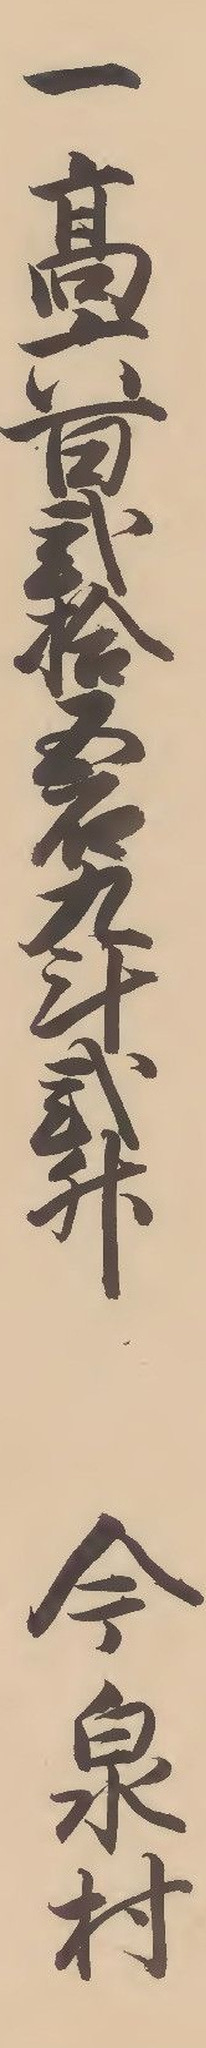一高六百弐拾五石九斗弐升今泉村
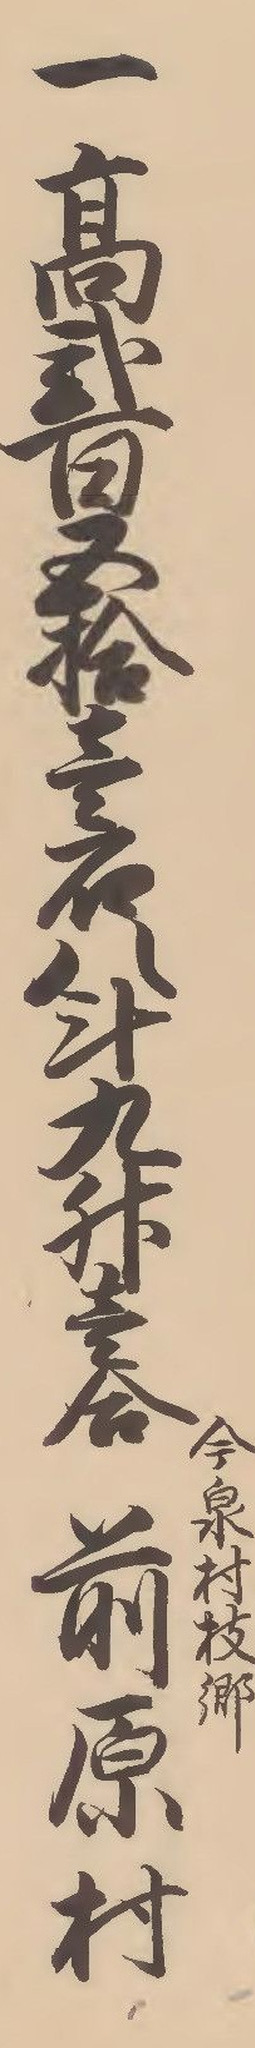一高弐百五拾壱石八斗九升壱合前原村
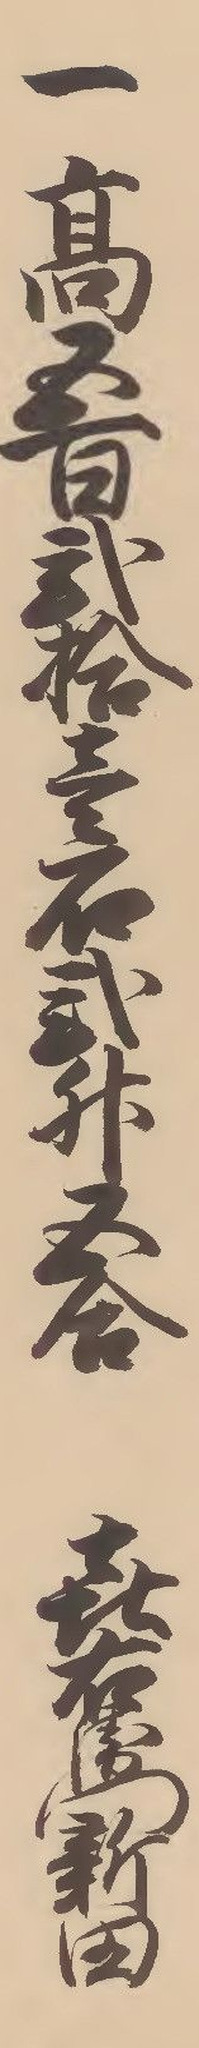一高五百弐拾壱石弐升五合喜右衛門新田

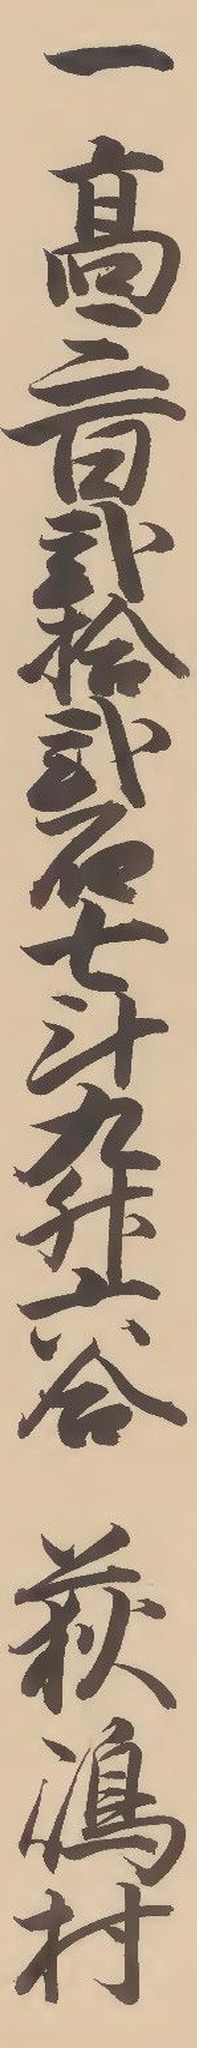一高三百弐拾弐石七斗九升六合萩嶋村
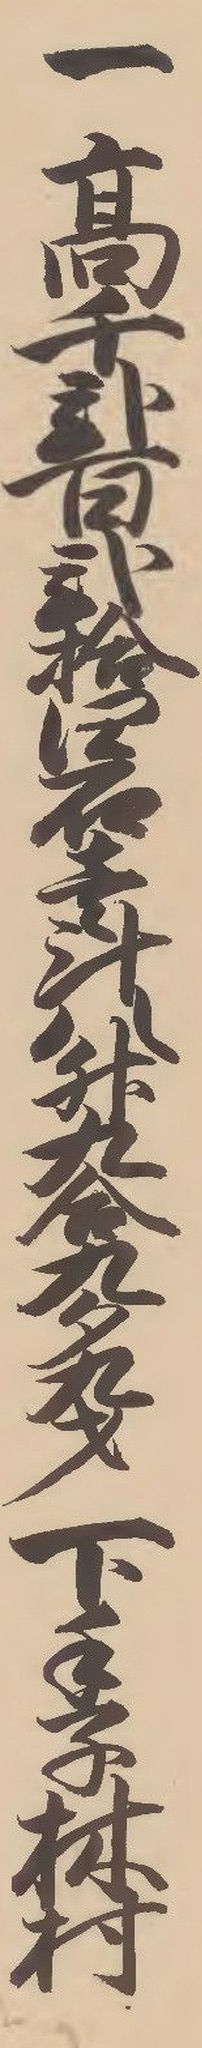一高千弐百弐拾四石壱斗八升九合九勺九才下手林村
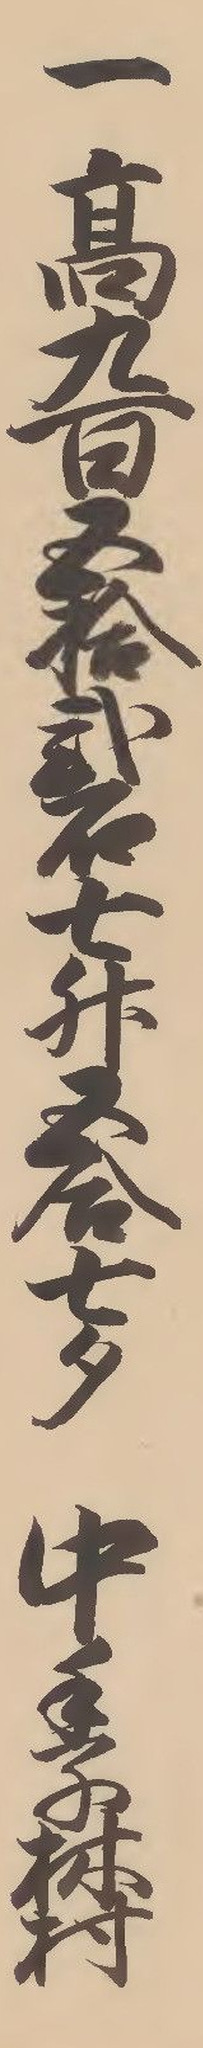一高九百五拾弐石七升五合七勺中手林村
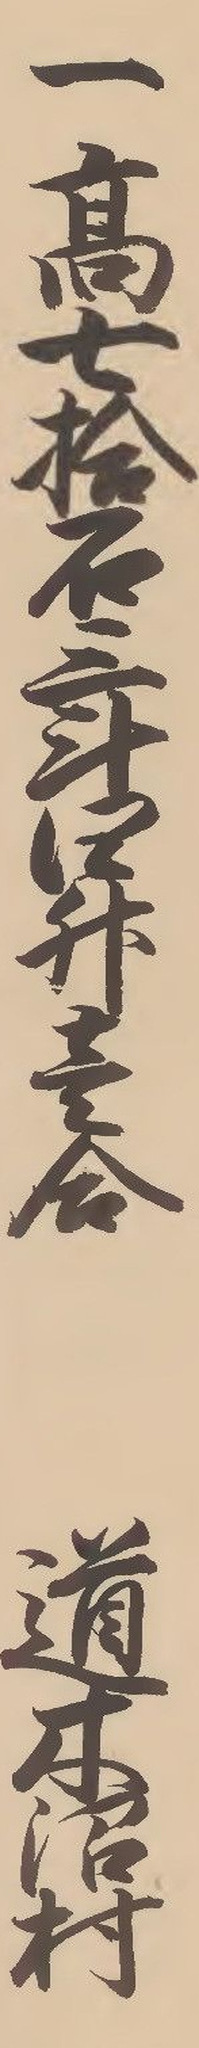一高七拾石三斗四升壱合道木沼村
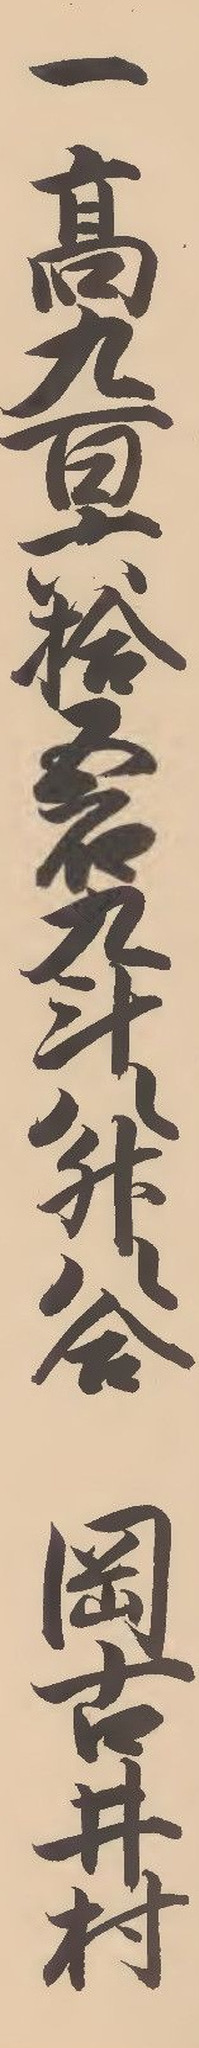一高九百六拾五石九斗八升八合岡古井村
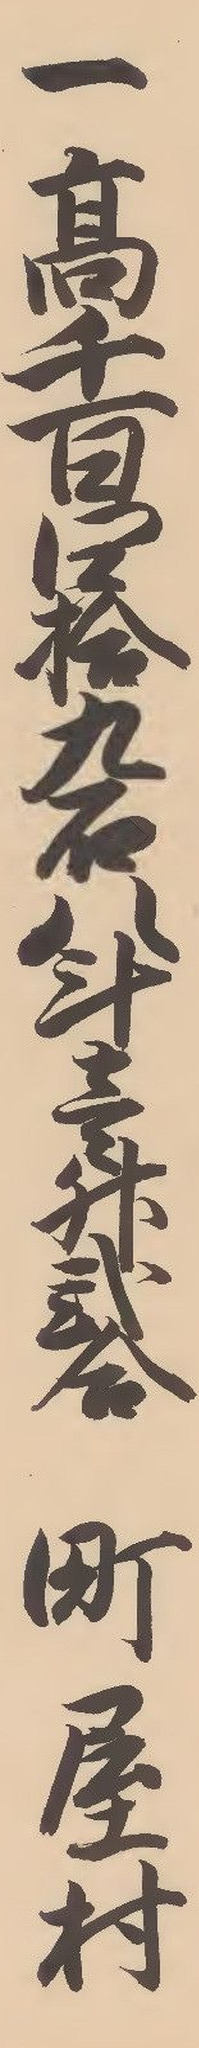一高千百四拾九石八斗壱升弐合町屋村
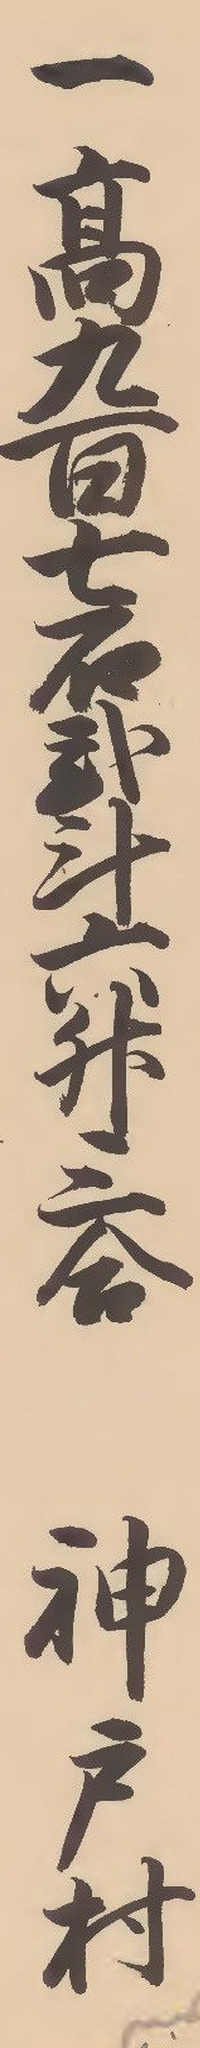一高九百七石弐斗六升三合神戸村
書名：武蔵国郷帳　下
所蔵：国立公文書館 National Archives of Japan
